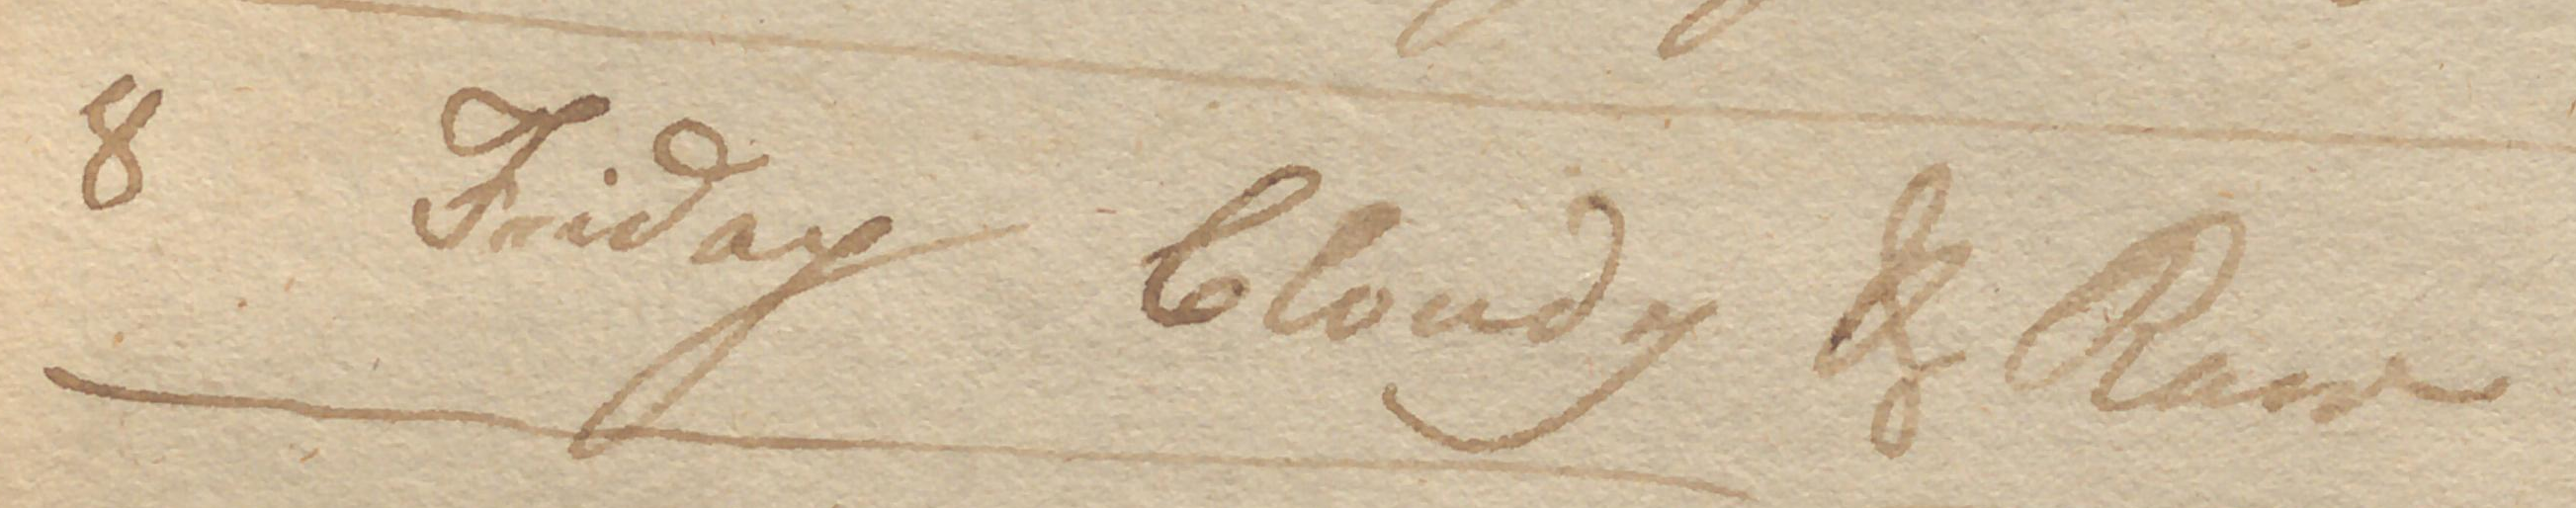8 Friday Cloudy & Raw
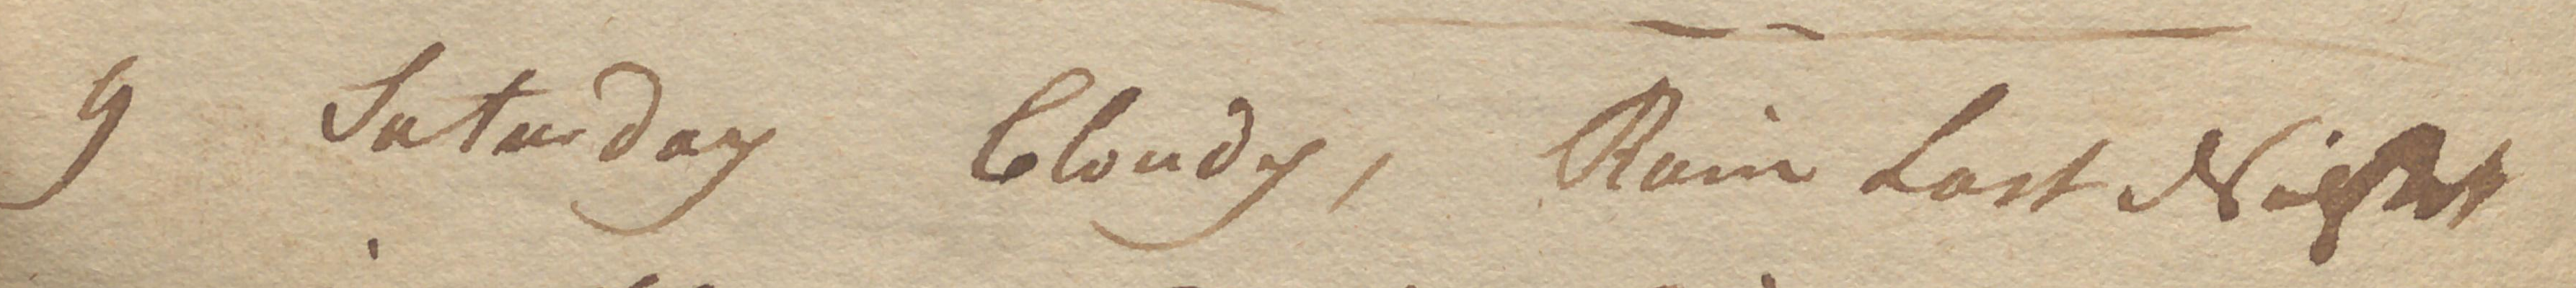9 Saturday Cloudy, Rain Last Night
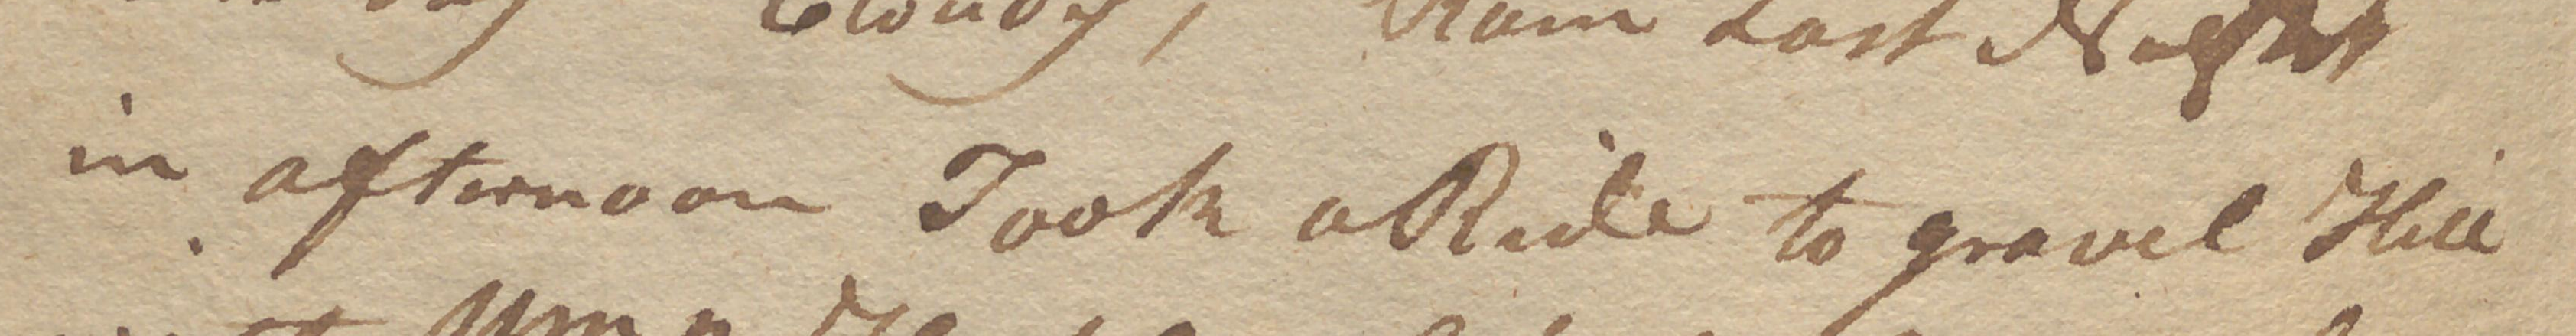in afternoon Took a Ride to gravel Hill
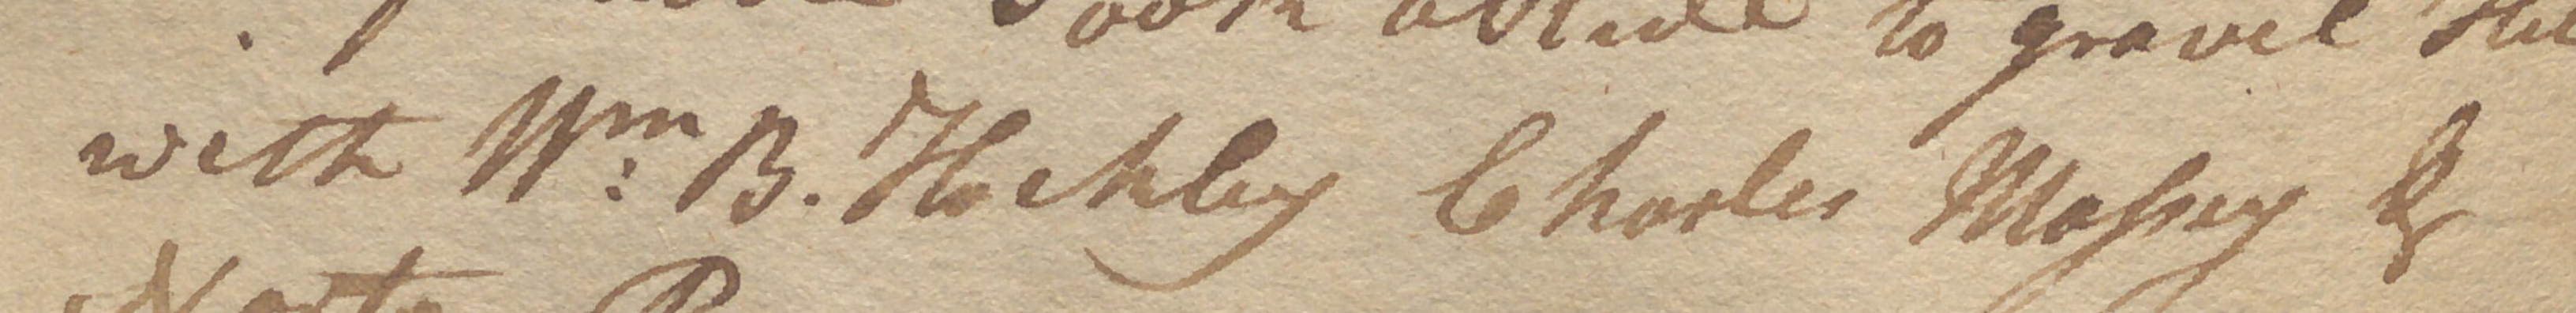with W^m. B. Hockley Charles Massey &
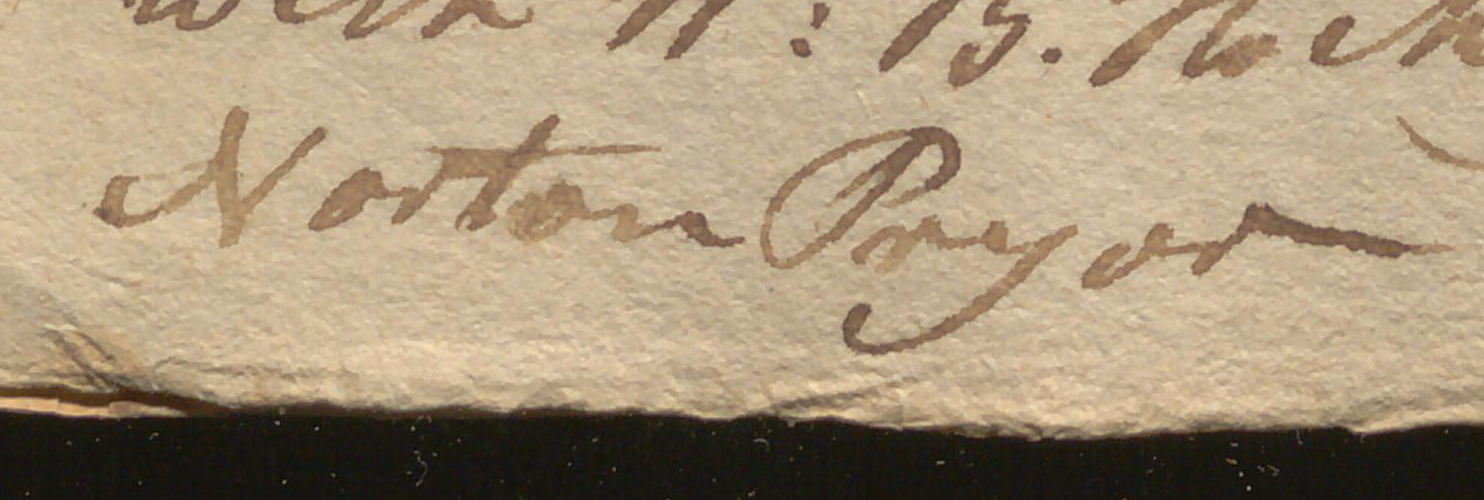Norton Pryor
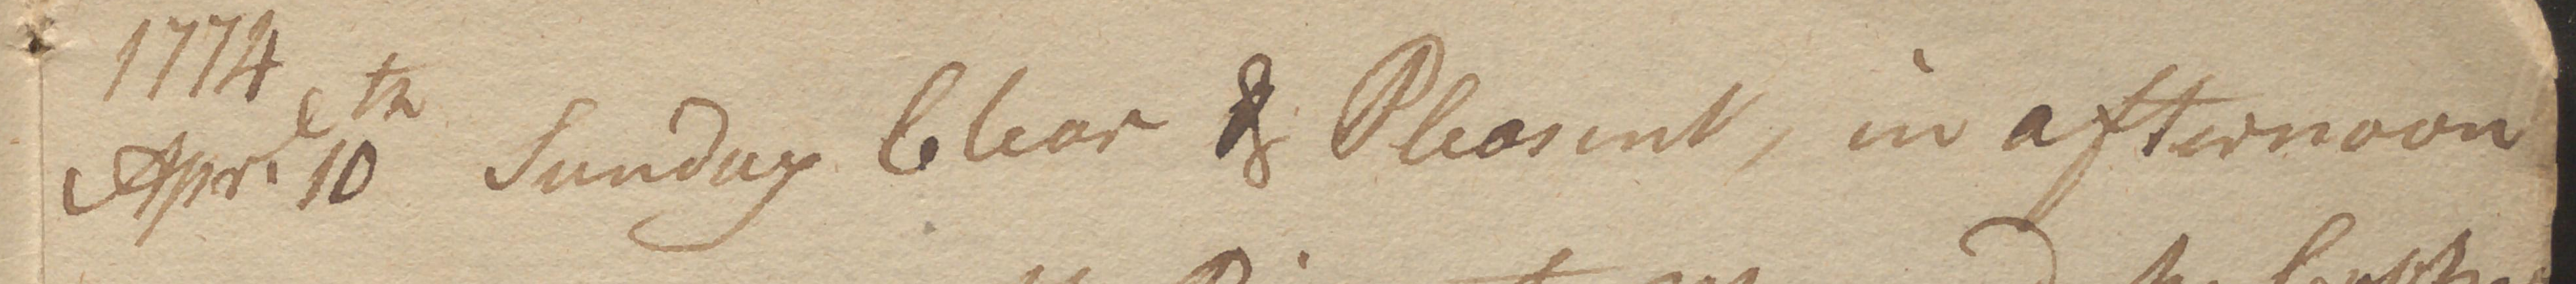Apr^l. 10 Sunday Clear & Pleasent, in afternoon
